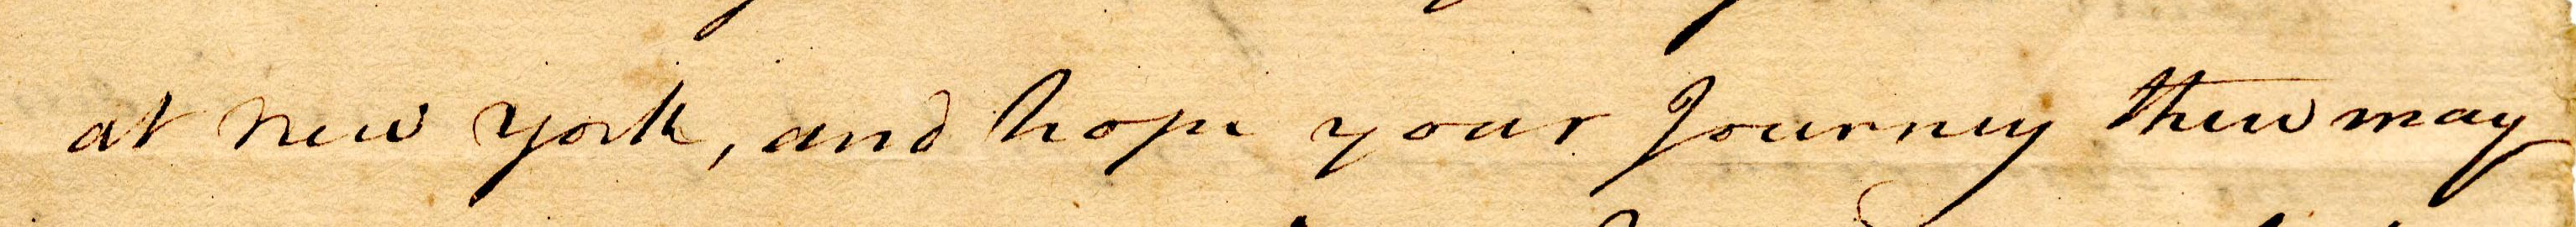at New York, and hope your Journey there may
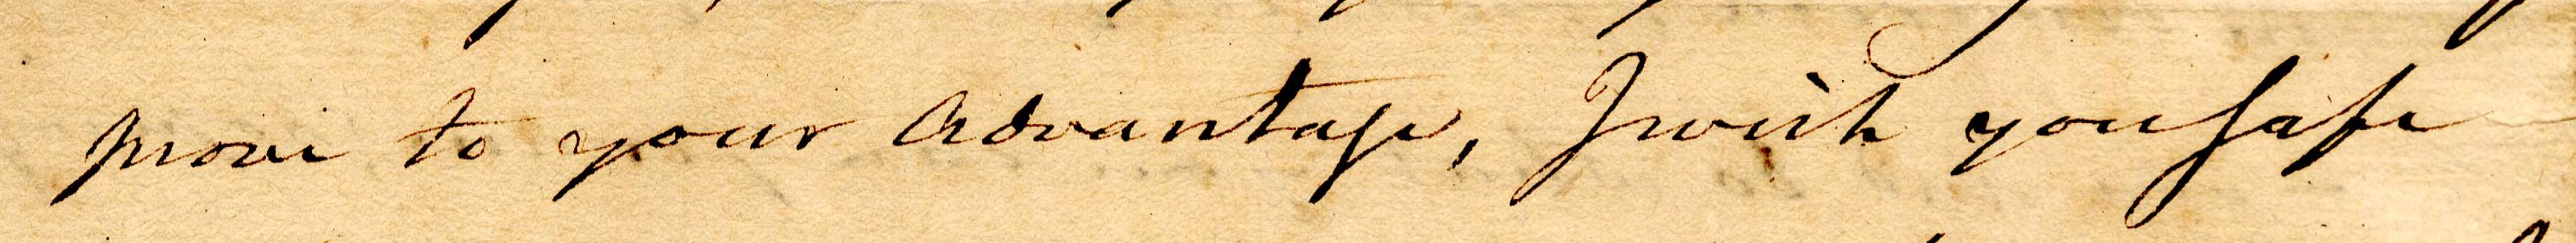prove to your Advantage, I wish you safe
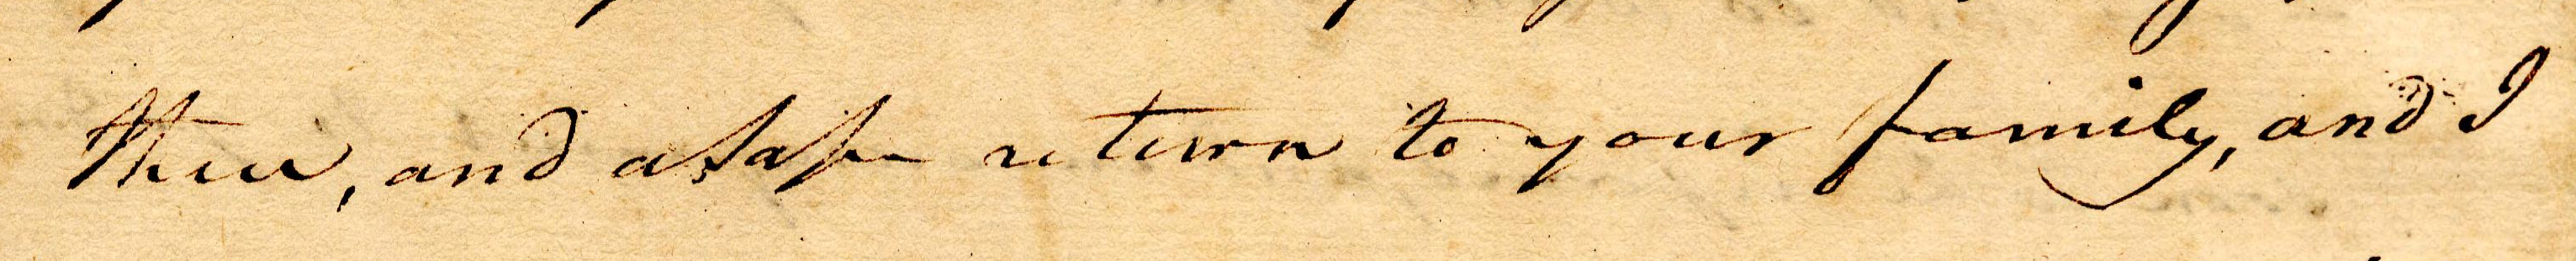there, and a safe return to your family, and I
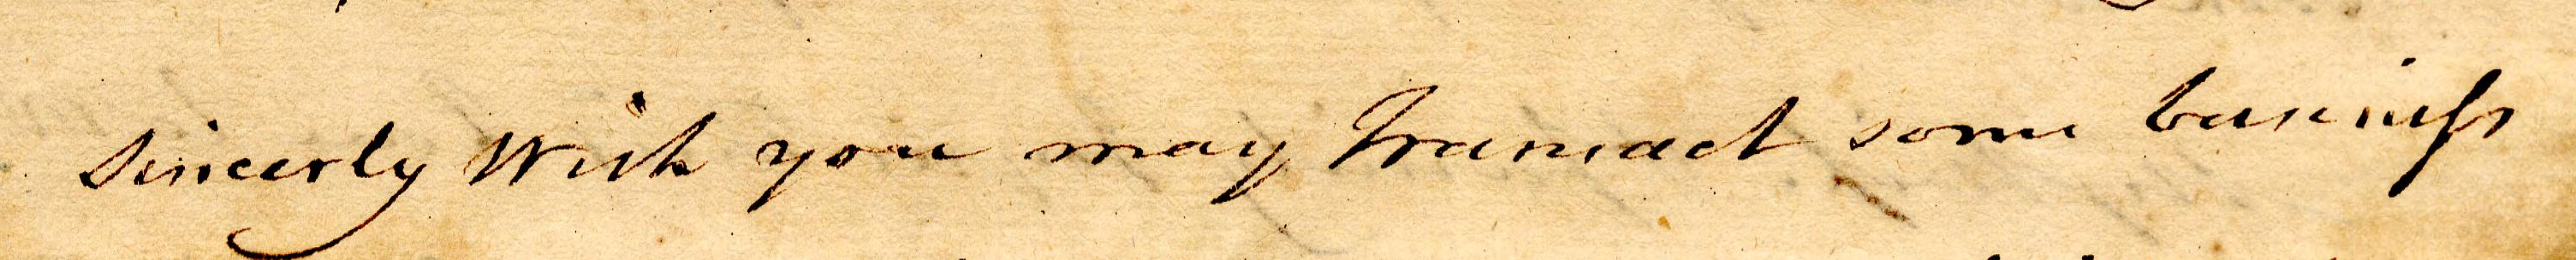sincerely Wish you may Transact some business
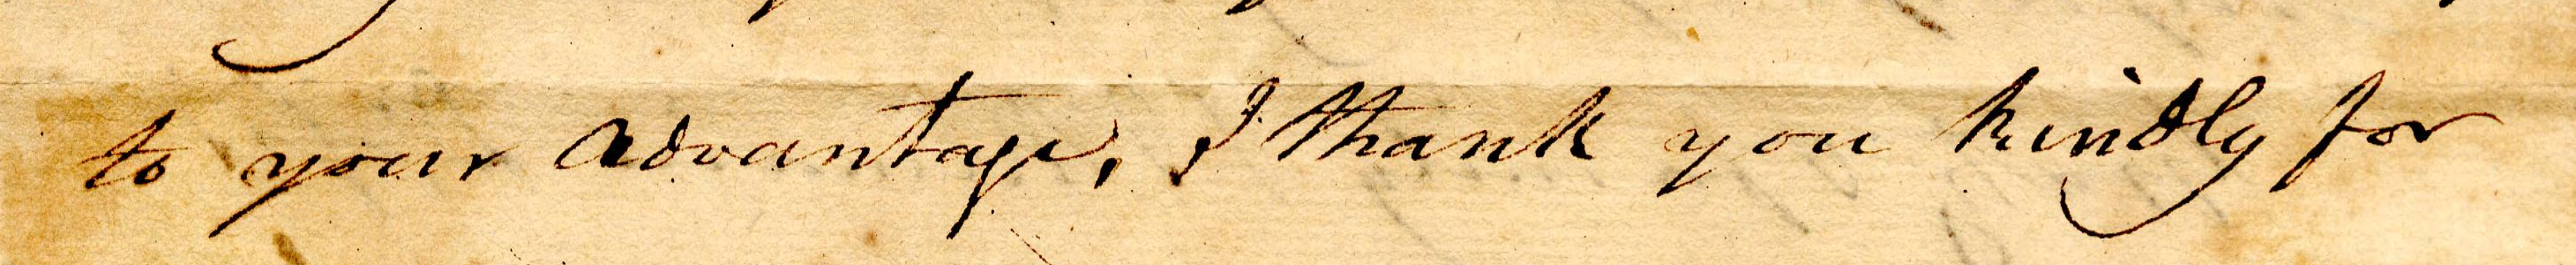to your Advantage, I thank you kindly for
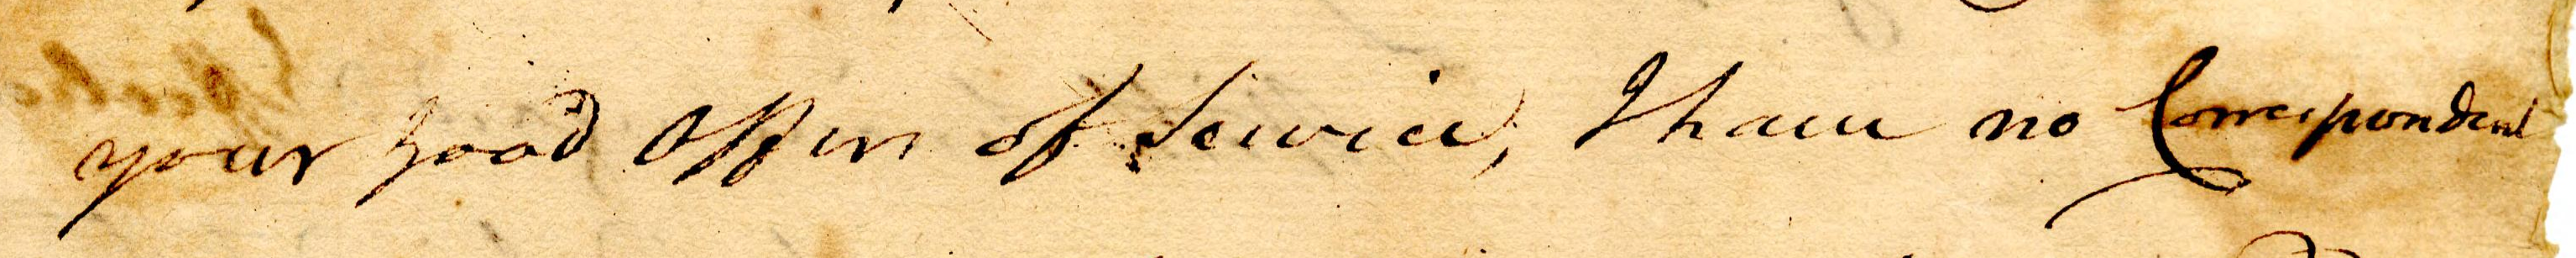your Good Offer of Service, I have no Correspondence
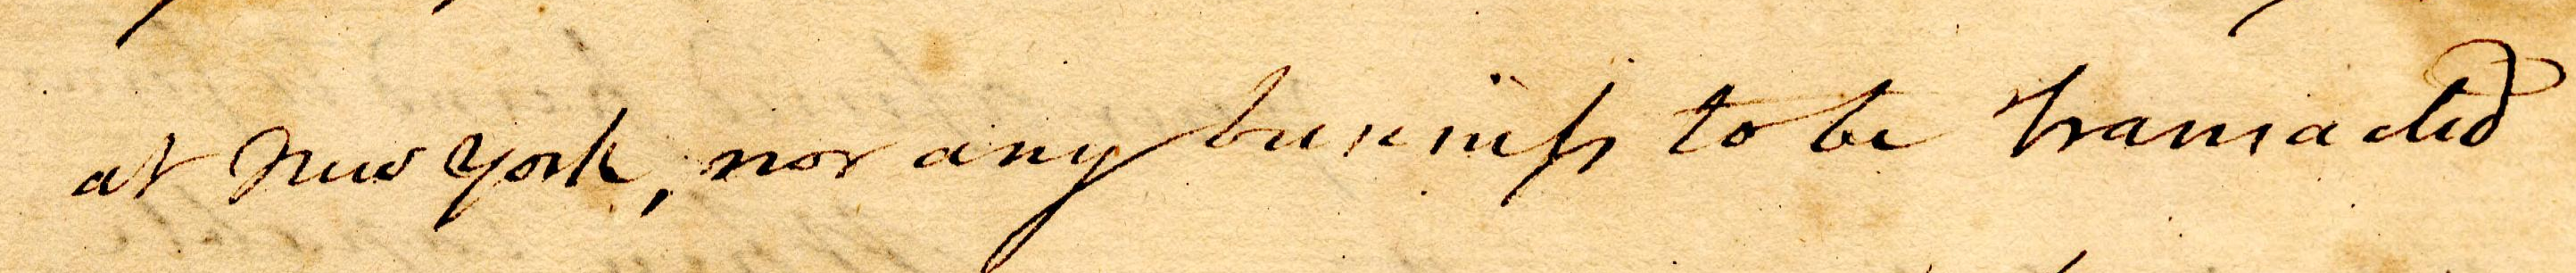at New York, nor any business to be transacted
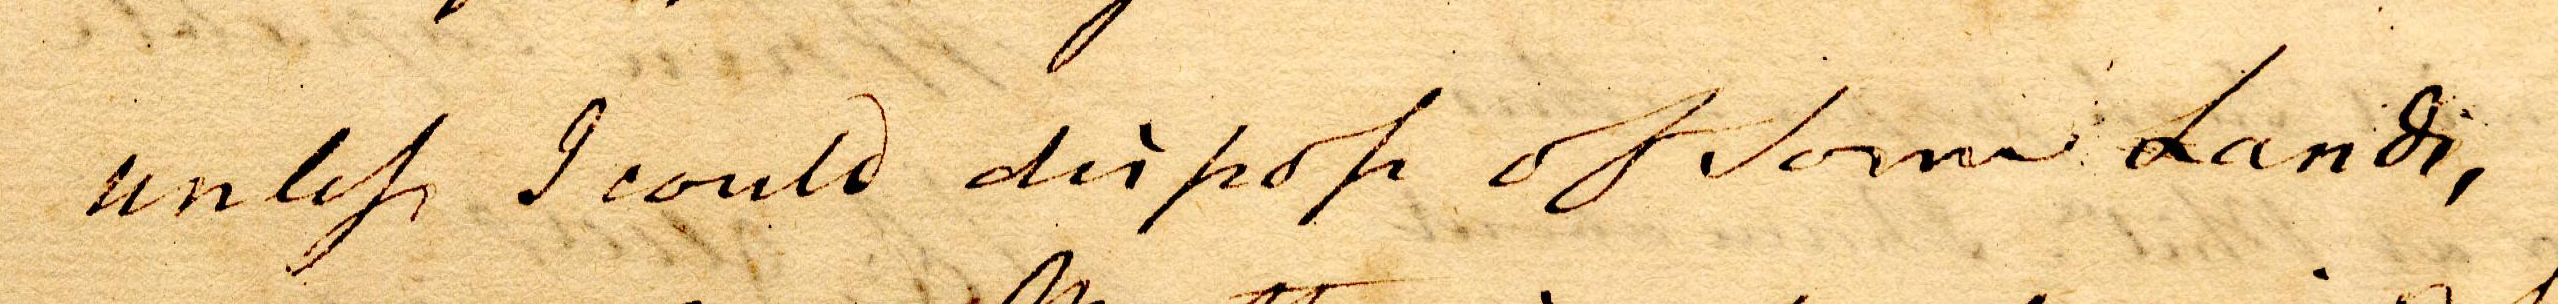unless I could dispose of Some Lands,
